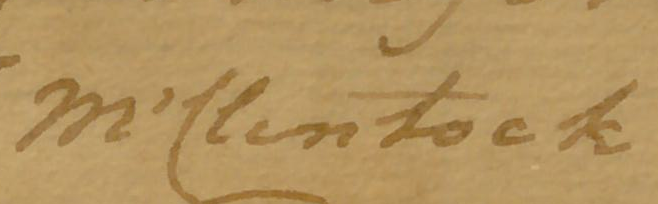M'Clintock
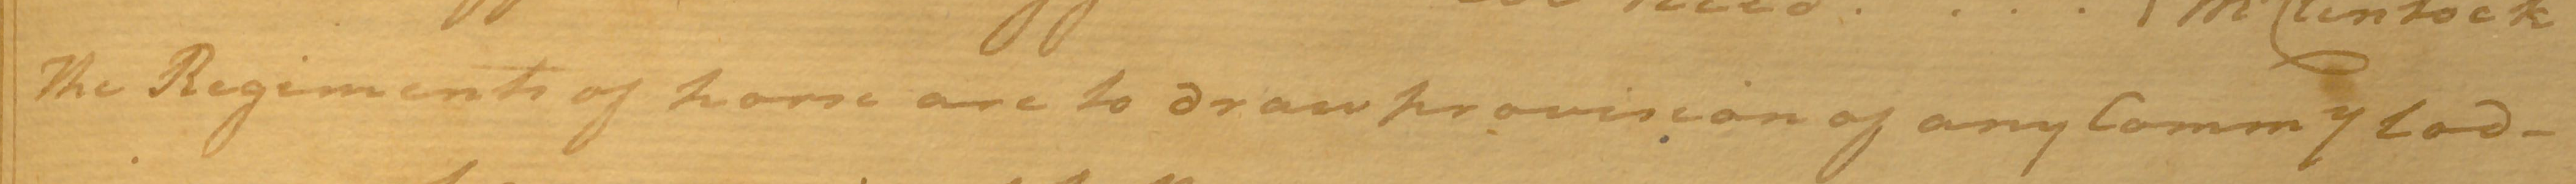The Regiments of horse are to draw provision of any Comm^y Lod-
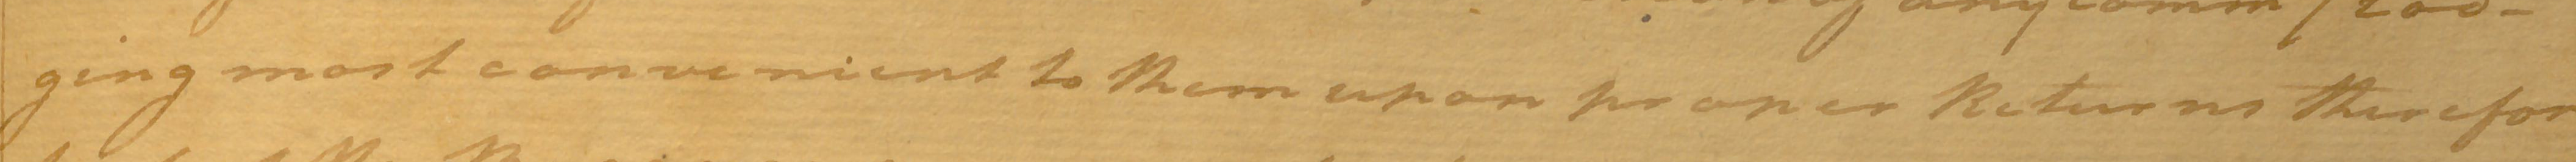ging most convenient to them upon proper Returns therefor
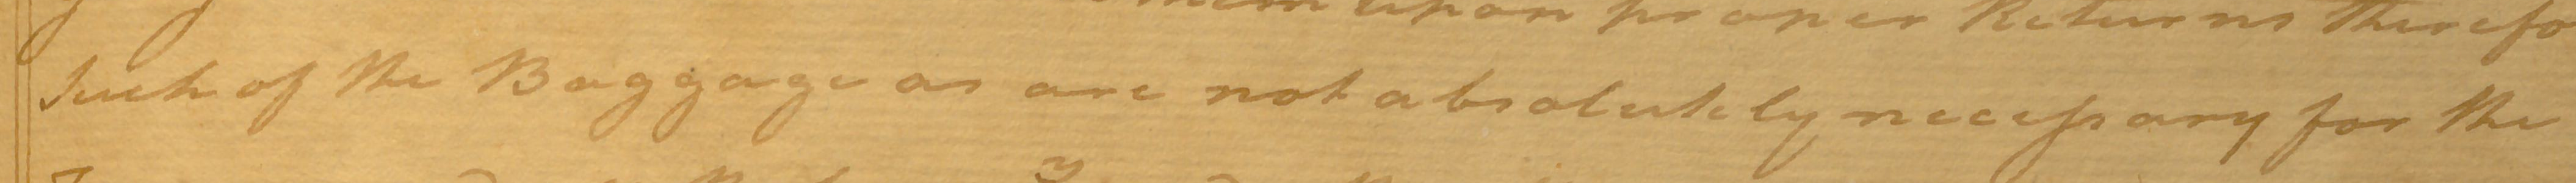such of the Baggage as are not absolutely necessary for the
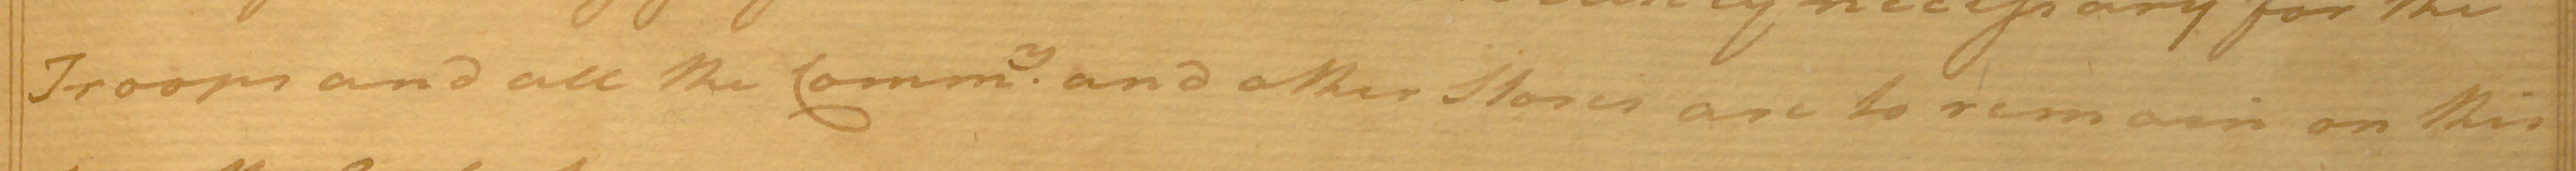Troops and all the Comm^y. and other Stores are to remain on this
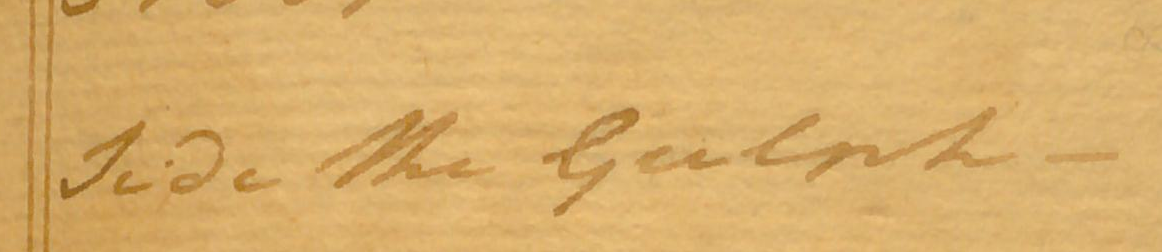side the Gulph-
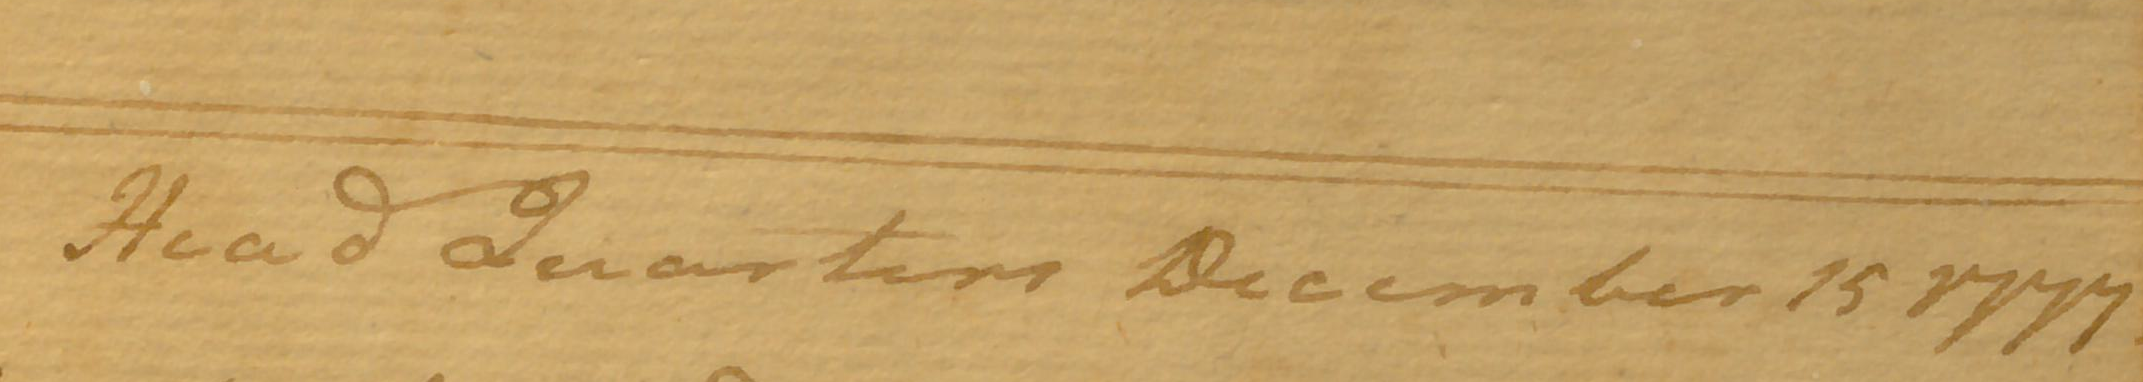Head Quarters December 15 1777
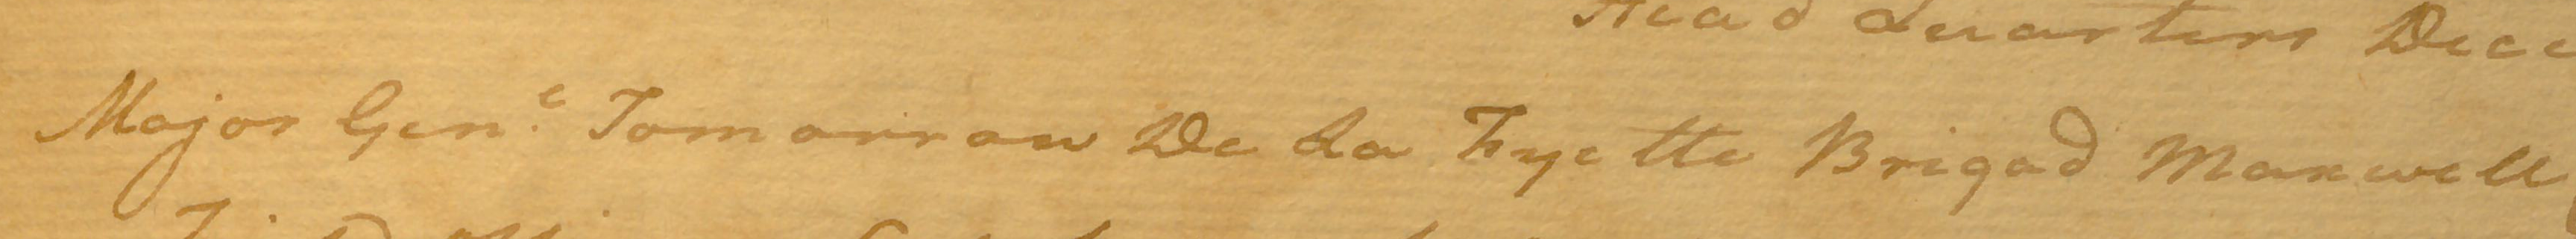Major Gen^l. Tomorrow De La Fyette Brigad Maxwell
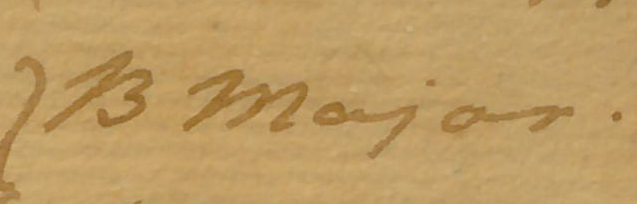B Major
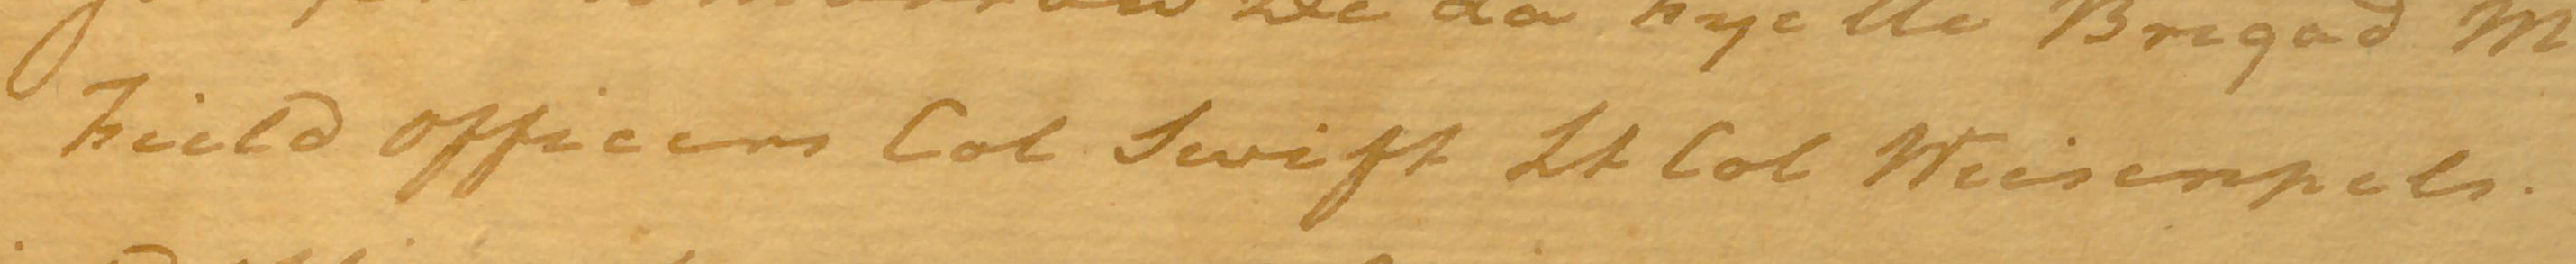Field officers Col Swift Lt Col Weisenspels.
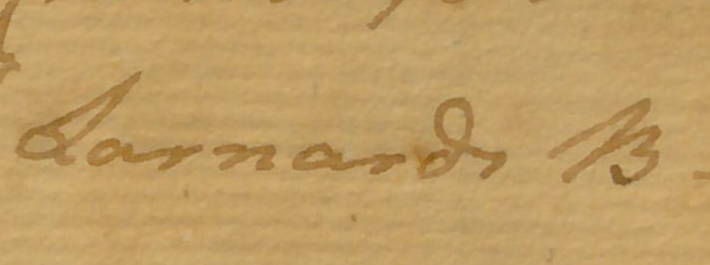Larnards B
